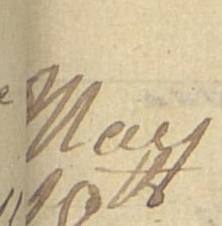May
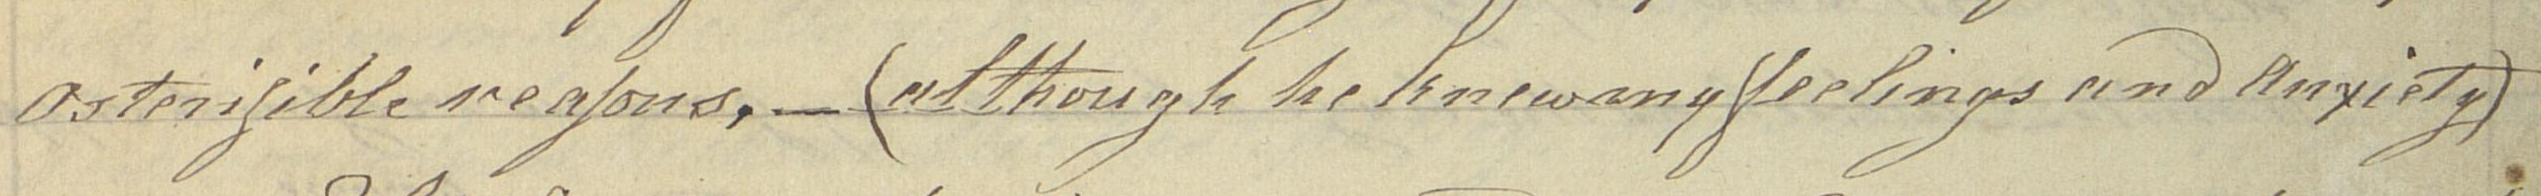ostensible reasons, (although he knew any feelings and Anxiety)
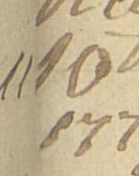10^th
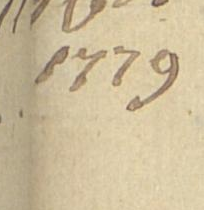1779
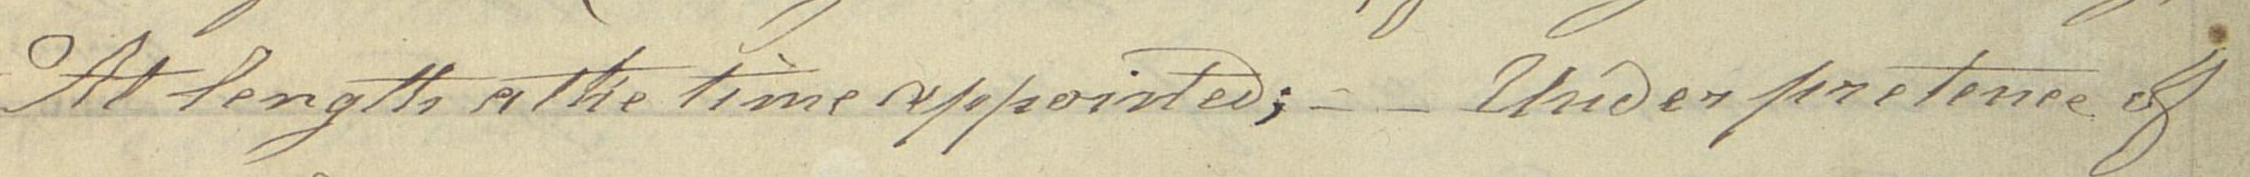At length at the time appointed; Under pretence of
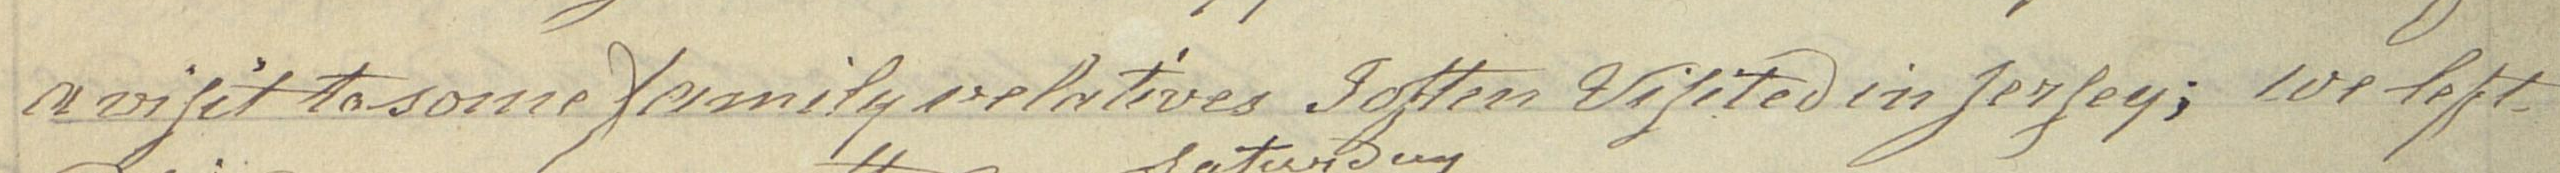a visit to some family relatives I often visited in Jersey; we left
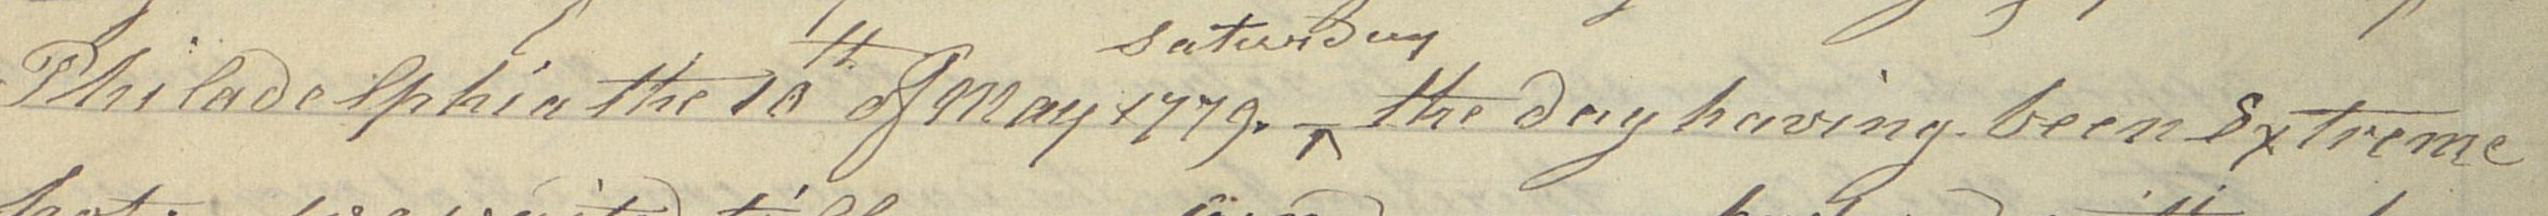Philadelphia the 10^th of May 1779 ^ the day having been Extreme
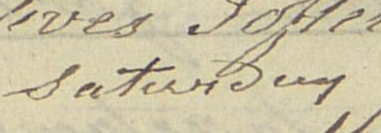Saturday
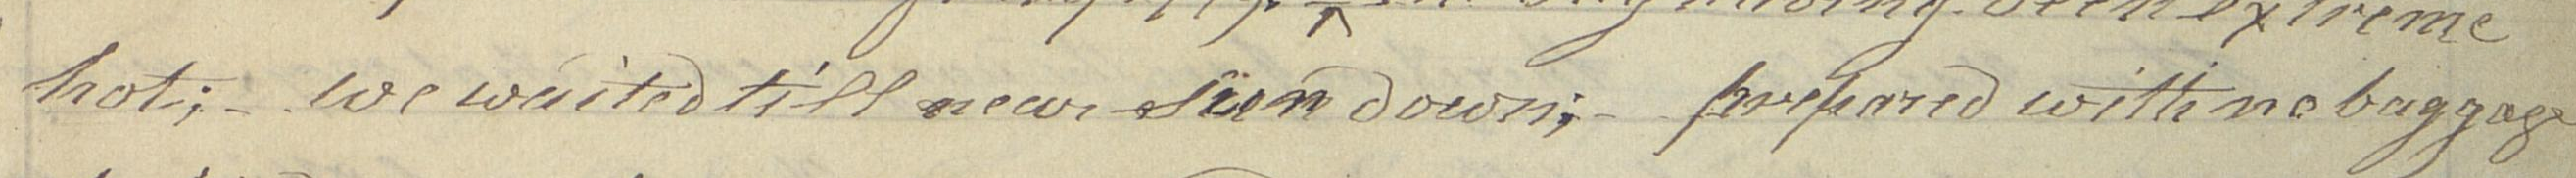hot; we waited till near sundown; prepared with no baggage
